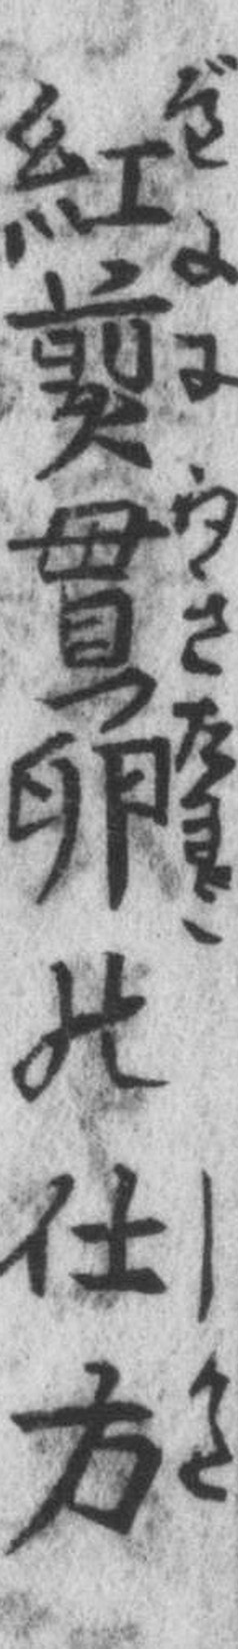紅煎貫卵の仕方
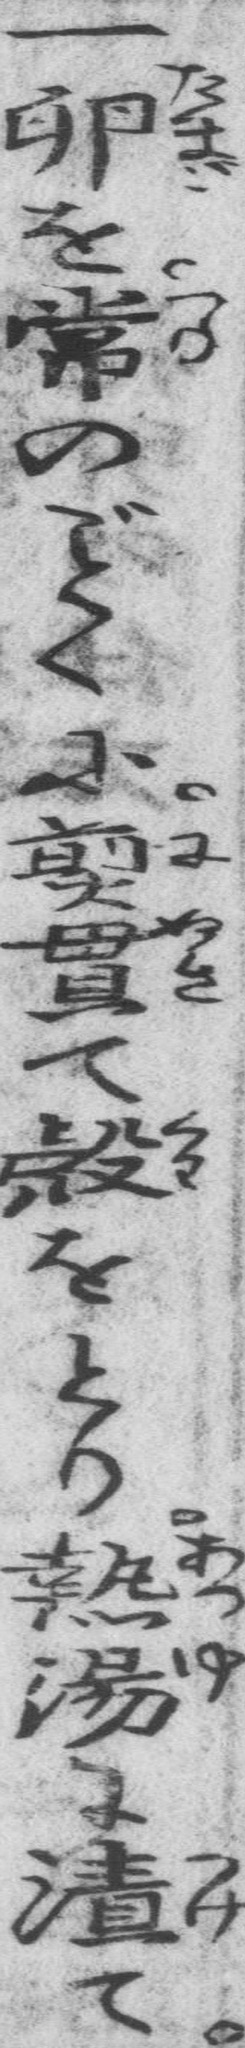一卵を。常のごとくに。煎貫て殻をとり。熱湯に漬て。
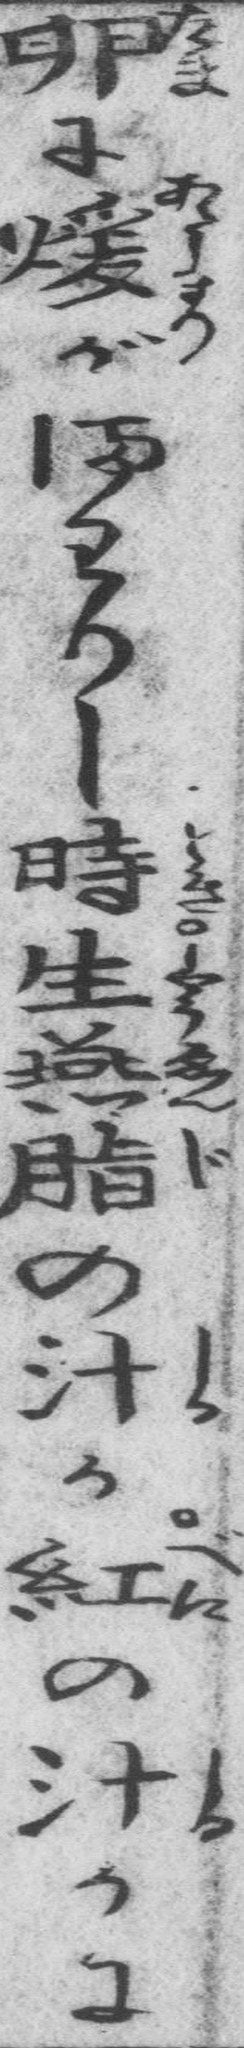卵に煖がまわりし時。生臙脂の汁か。紅の汁かに
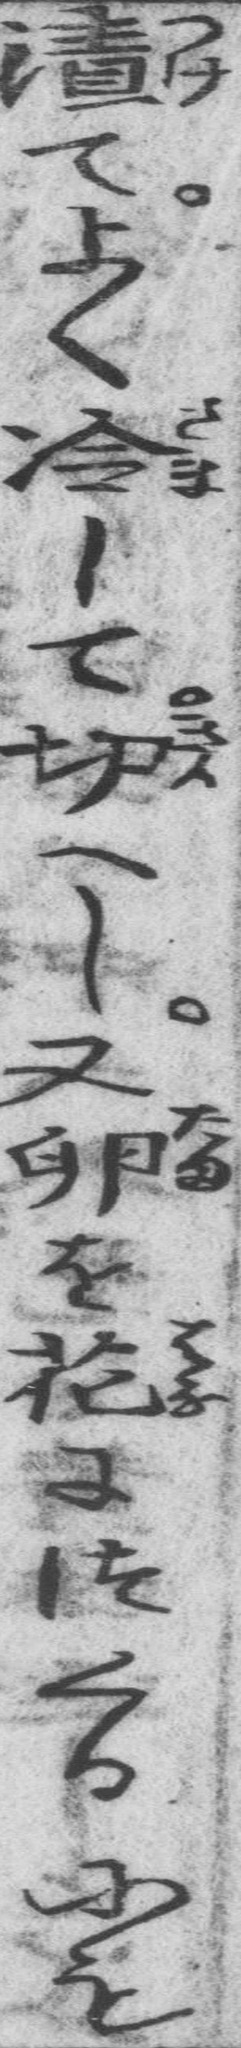漬て。よく冷して。切へし。又卵を花につくるにも
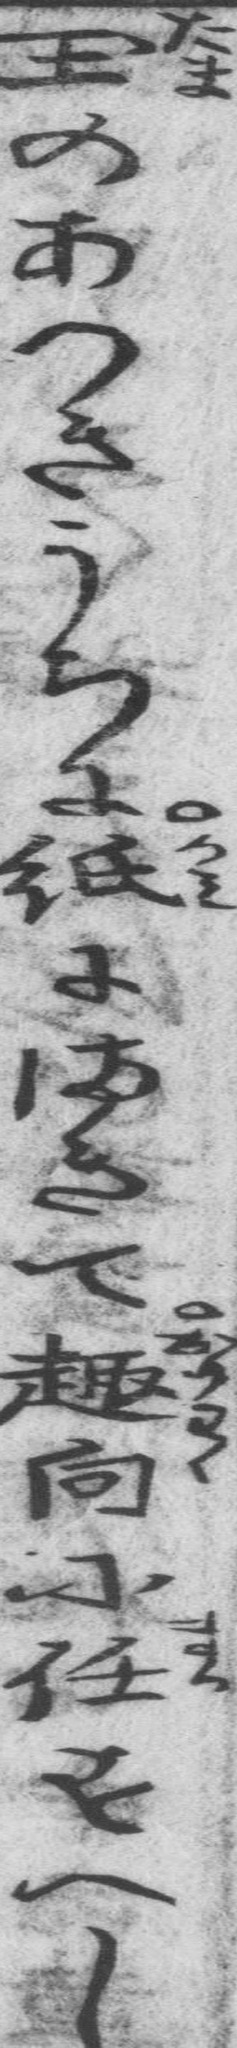玉のあつきうちに。紙にまきて。趣向に任すへし
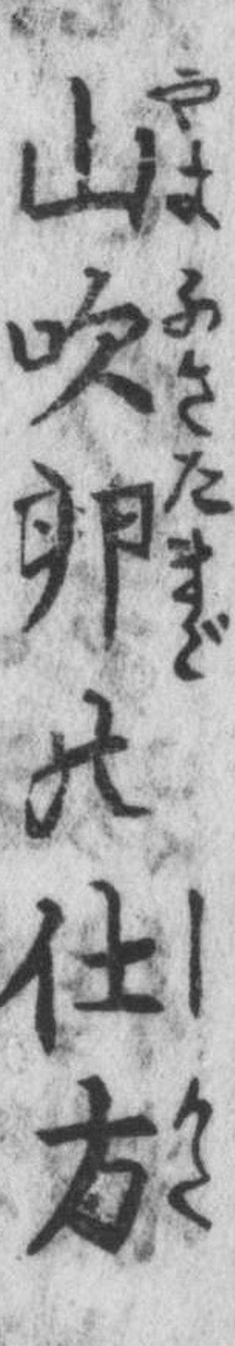山吹卵の仕方
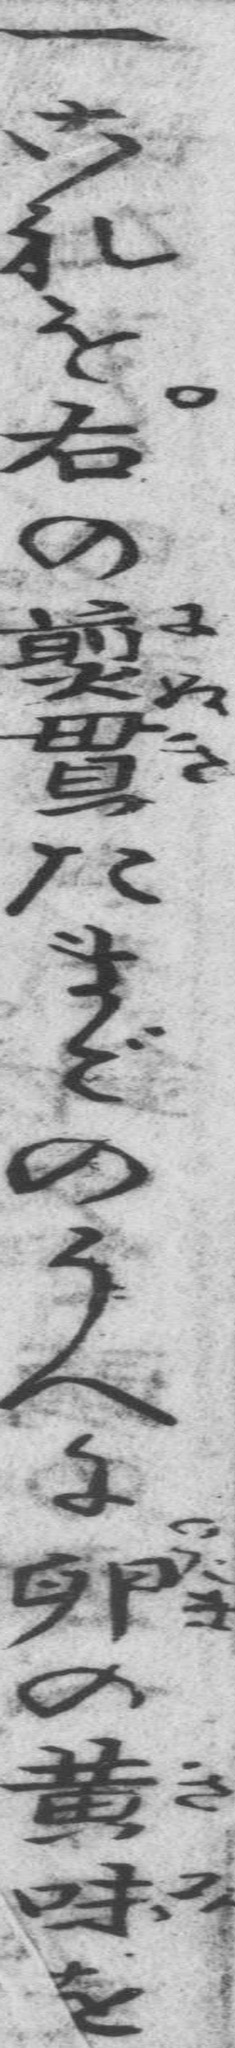一これも。右の煎貫たまごのうへに。卵の黄味を
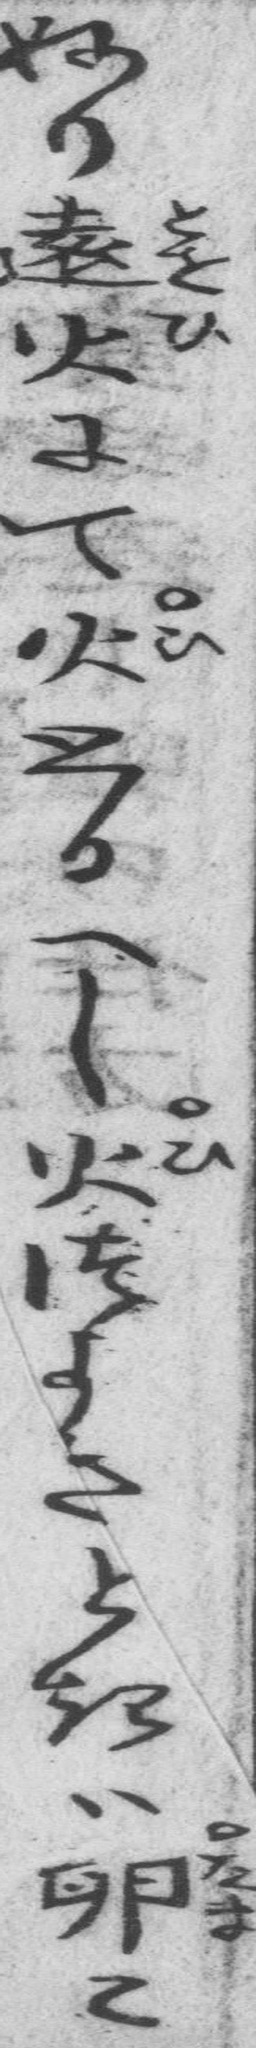ぬり遠火にて。火とるへし。火つよきときは。卵こ
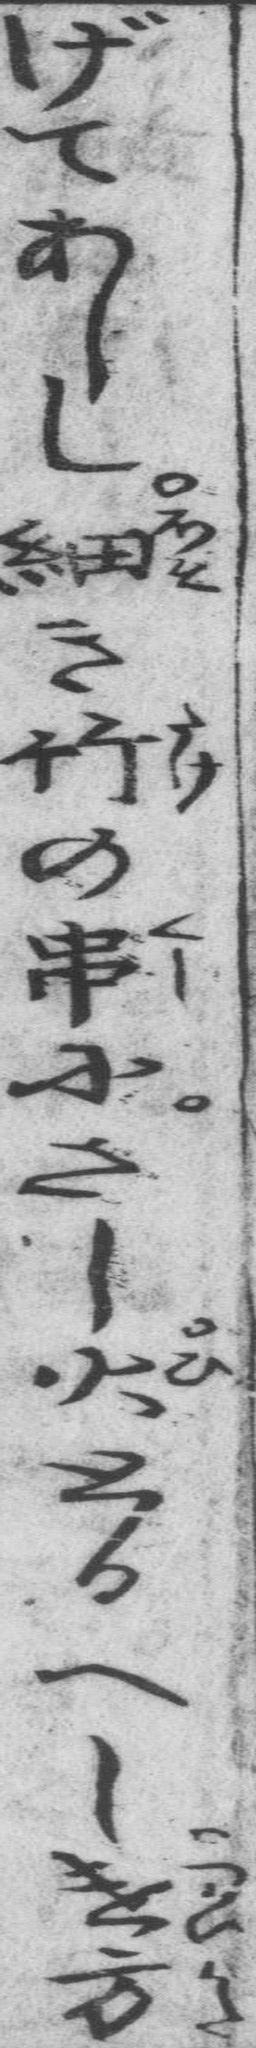げてあしし。細き竹の串に。さし。火とるへし。遣方

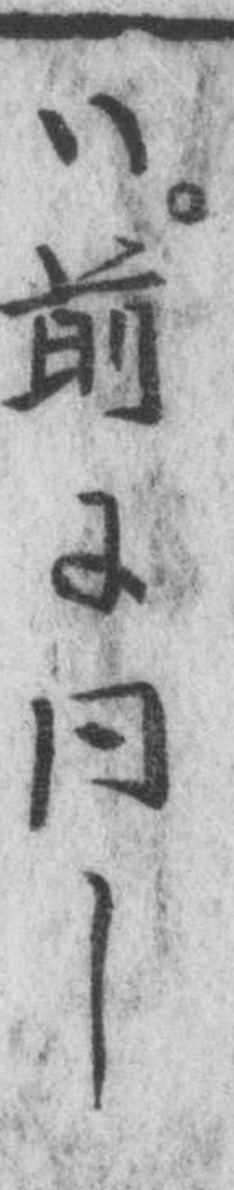は。前に同し
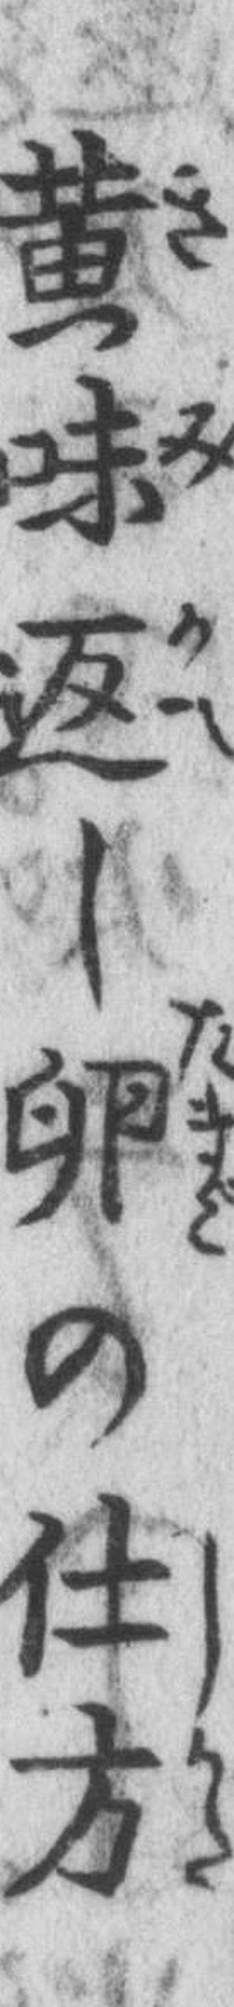黄味返し卵の仕方
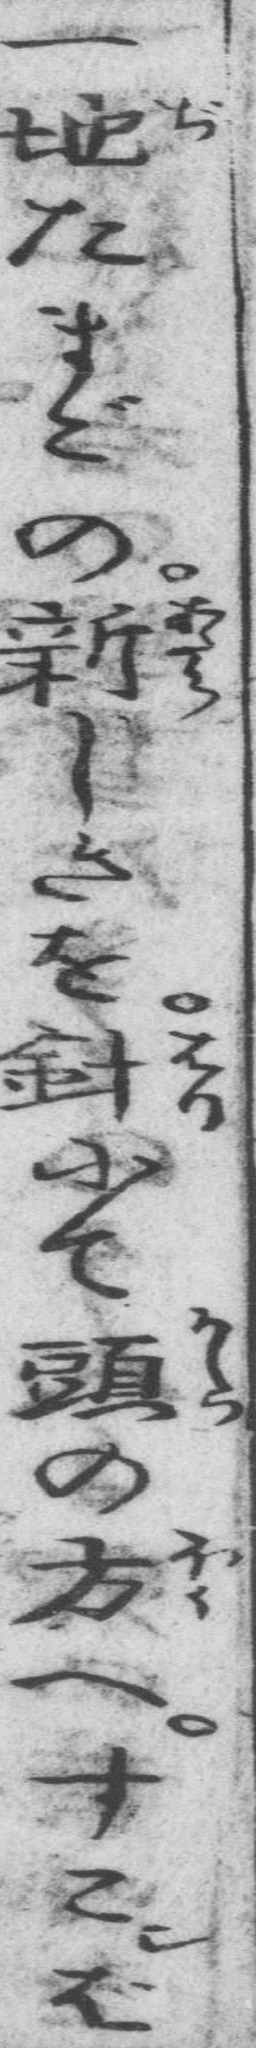一地たまごの。新しきを。針にて頭の方へ。すこしば
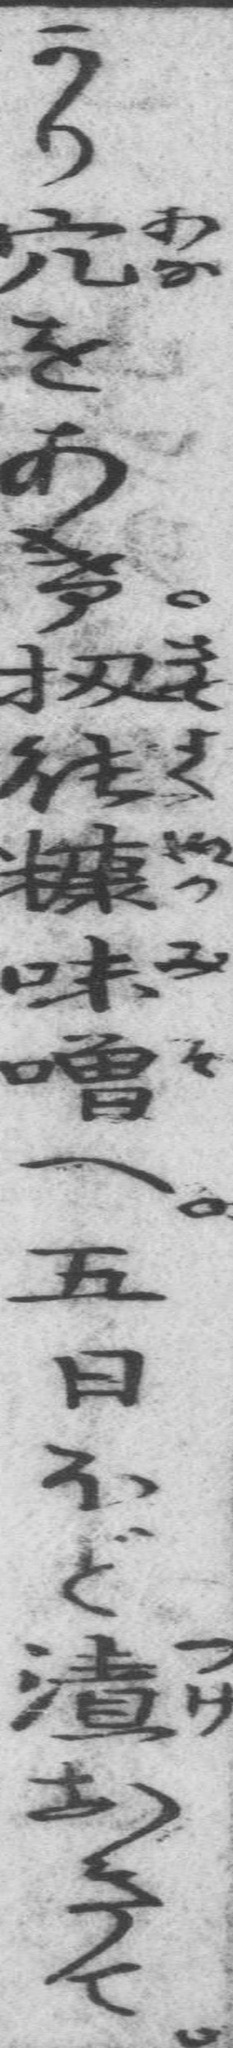かり穴をあけ。扨能糠味噌へ。五日ほど漬おきて。
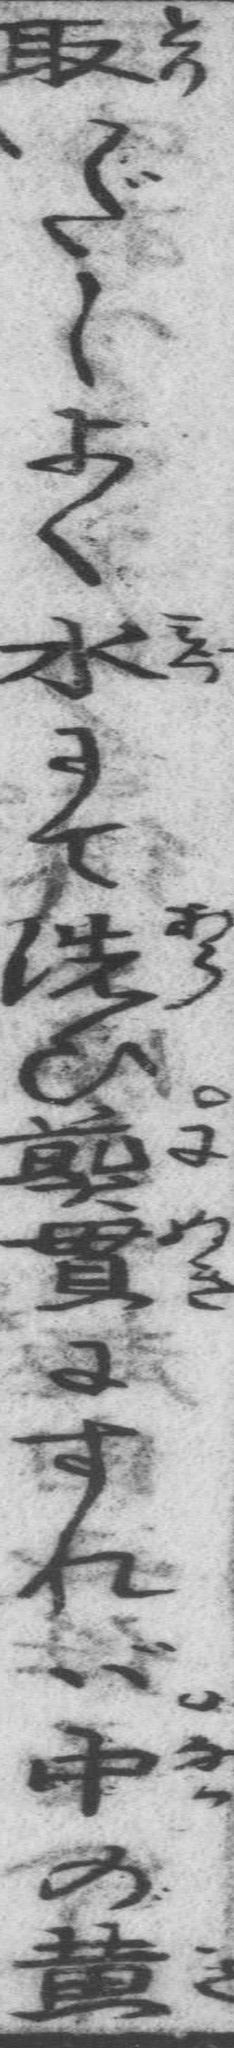取いだしよく水にて洗ひ。煎貫にすれば。中の黄
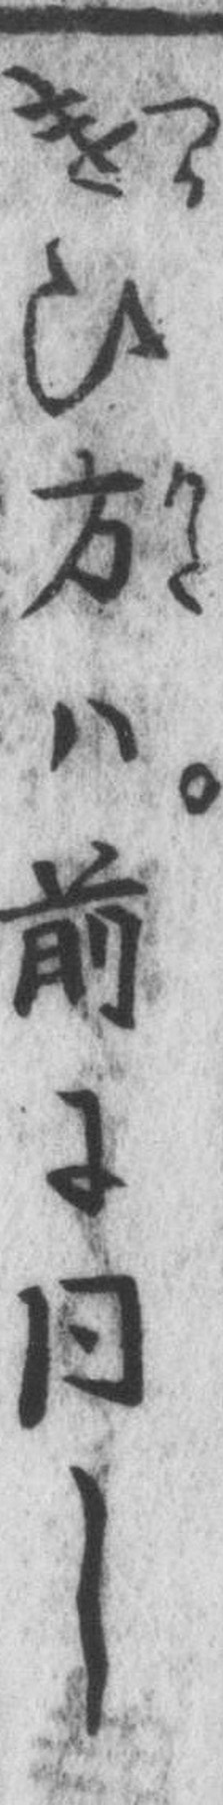遣ひ方は。前に同し
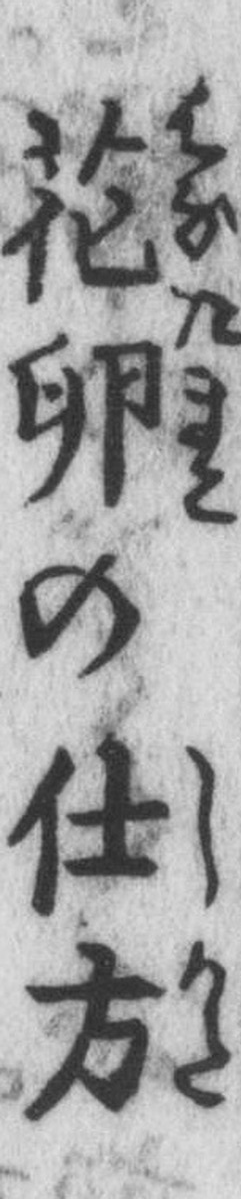花卵の仕方
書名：萬寳料理秘密箱
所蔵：大阪府立大学学術情報センター 国文学研究資料館
